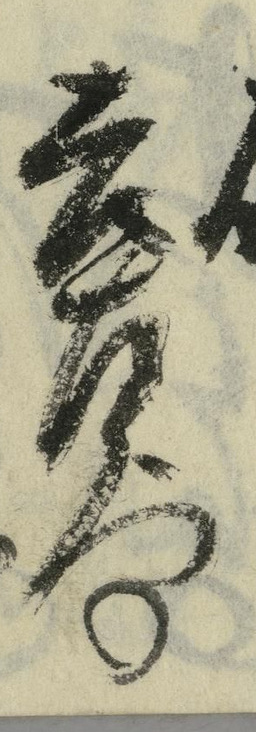兵左衛門
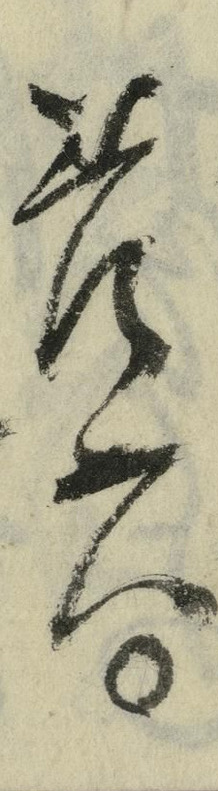子半右衛門
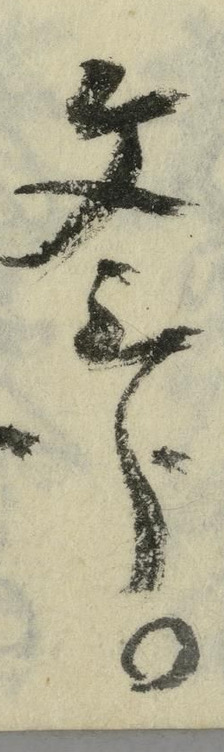文三郎
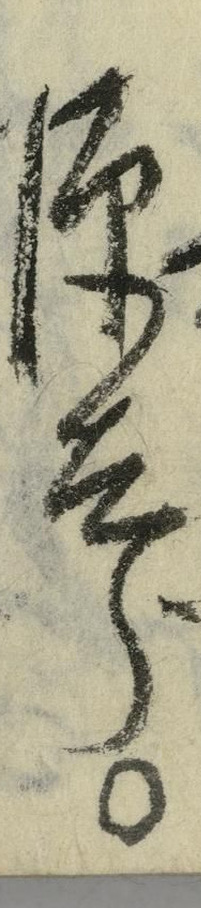源三郎
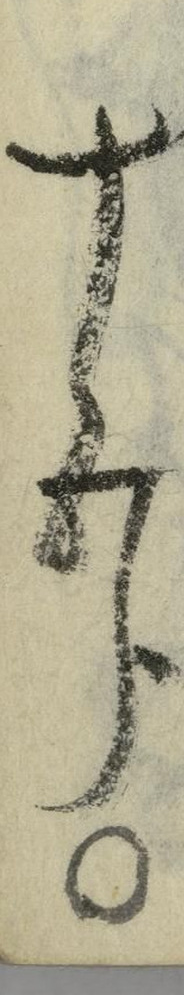十五郎

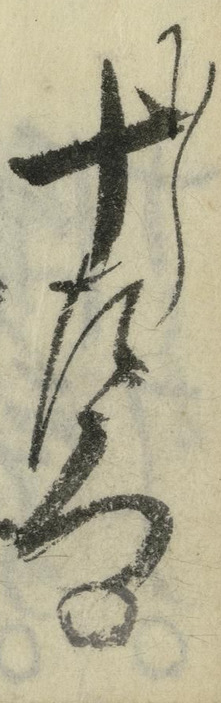十左衛門
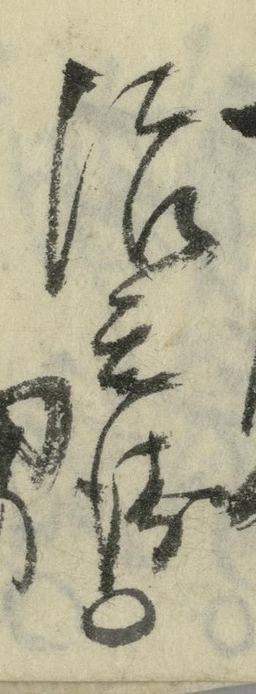治兵衛
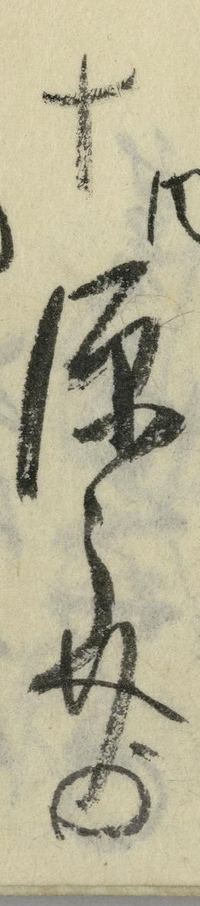十内源之介
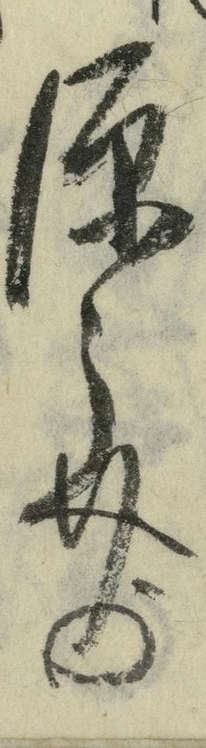治兵衛
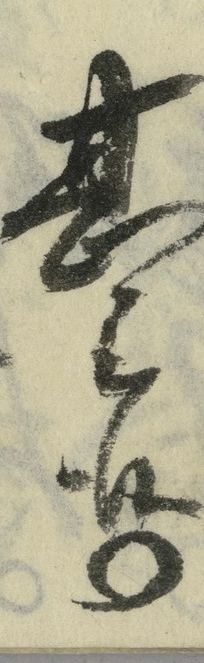甚兵衛
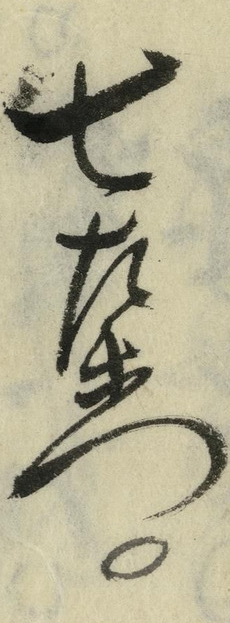七左衛門
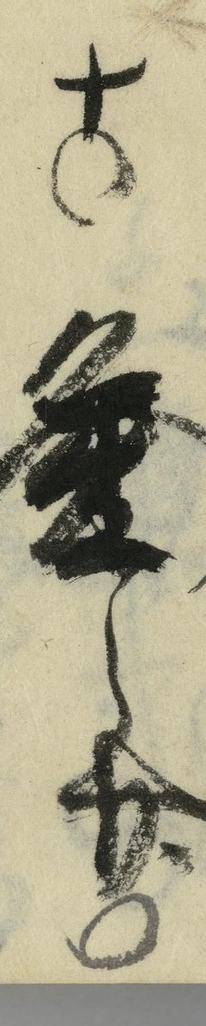十金之介
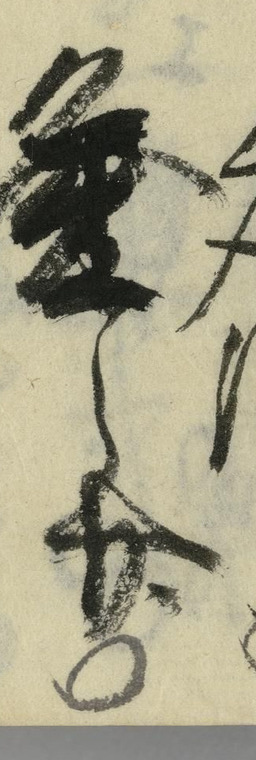同利兵衛
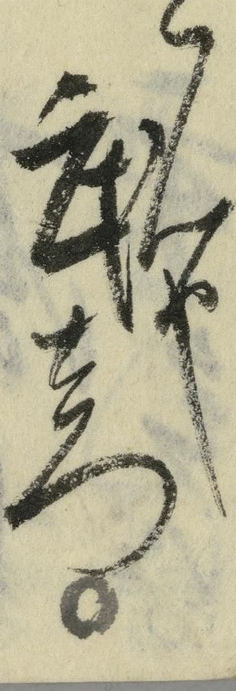兵右衛門
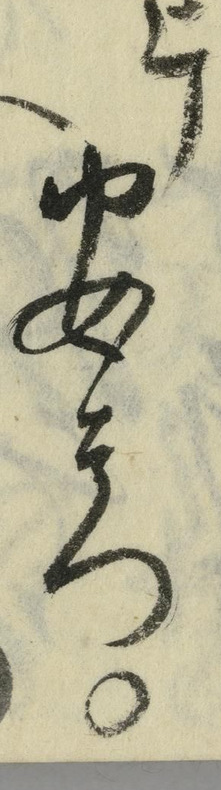兵右衛門

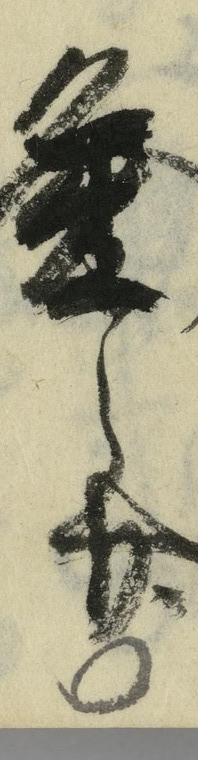同九兵衛
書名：天明淺間噴火ニ関スル書類
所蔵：東京大学地震研究所図書室 Earthquake Research Institute Library, The University of Tokyo, JAPAN
